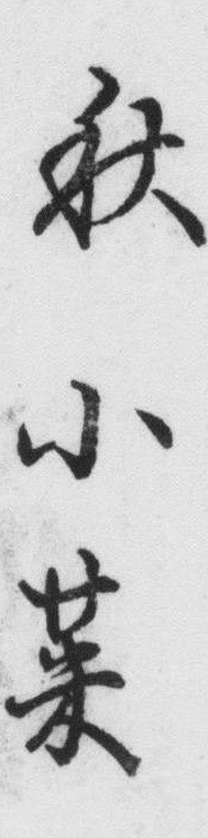秋小菜
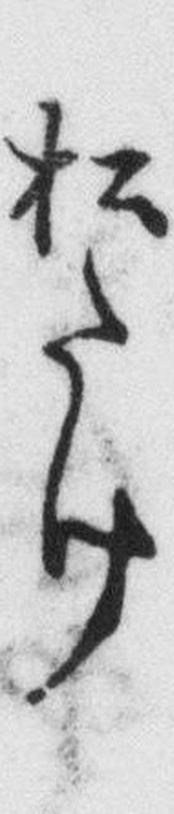松たけ

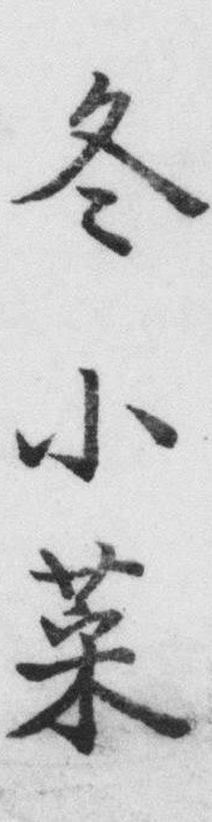冬小菜
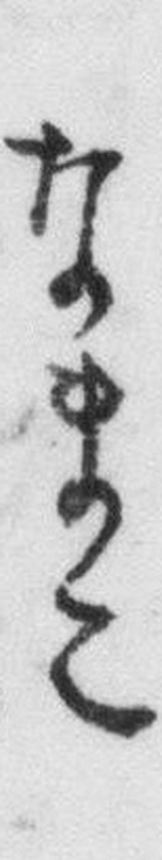なまこ
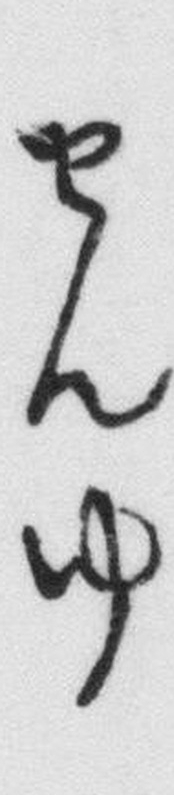せんゆ

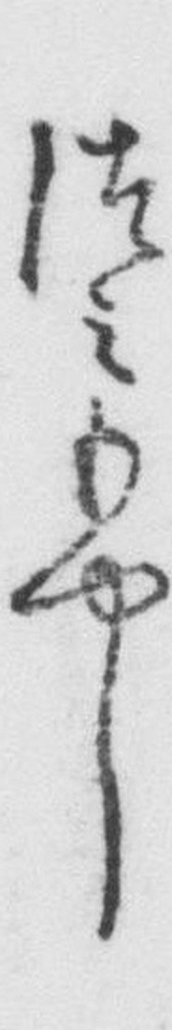徒みもやし
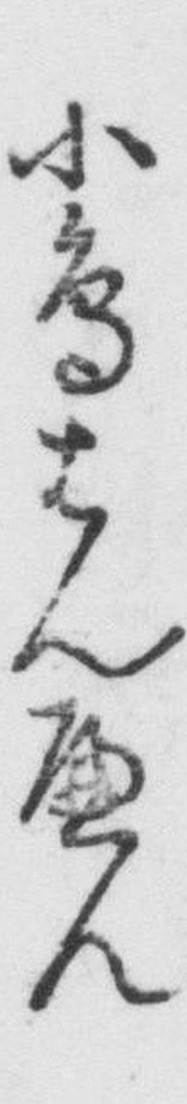小鳥はん扁ん
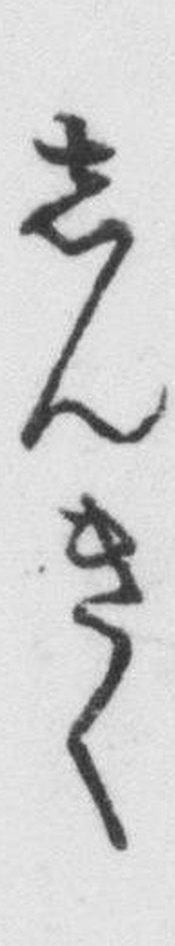志んきく
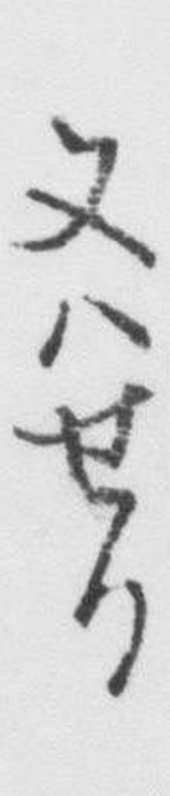又はせり

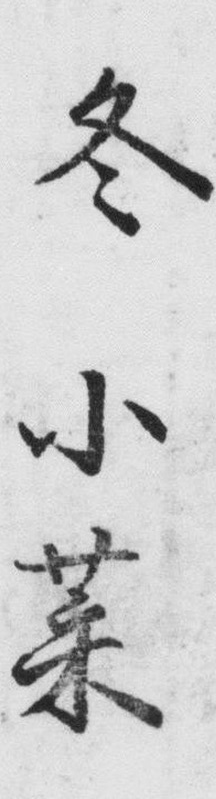冬小菜
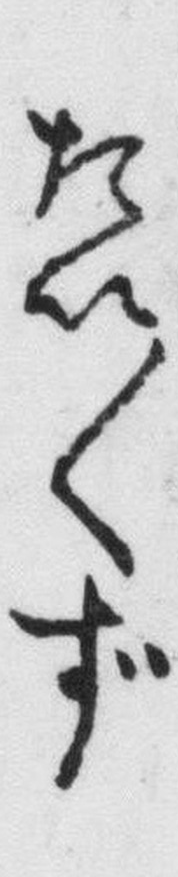たい〳〵ず
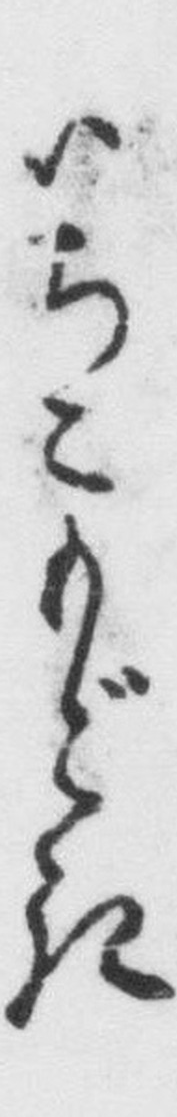いちごもど起

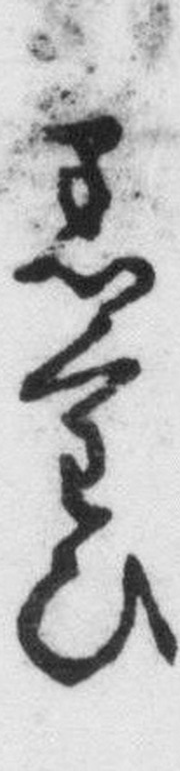黒くわひ
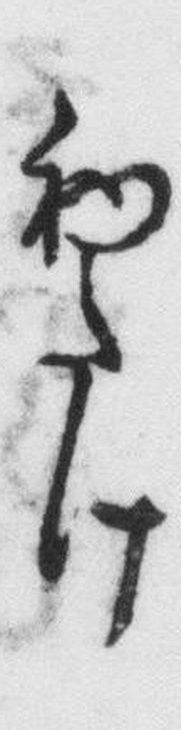初たけ
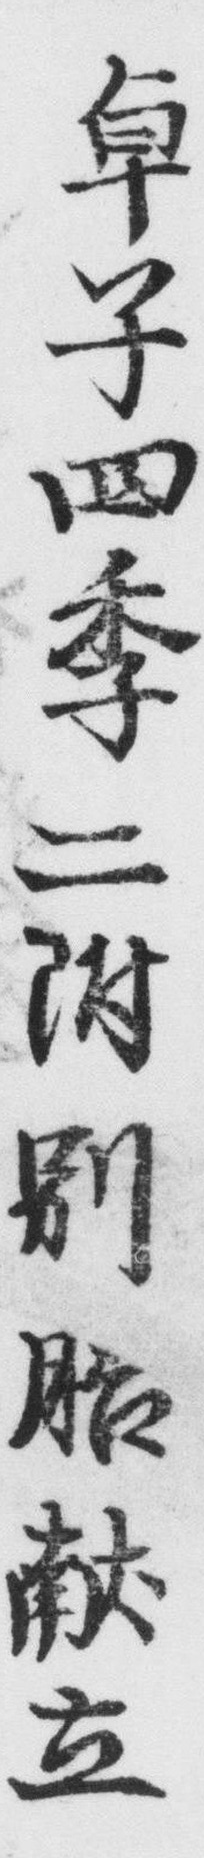卓子四季二附別膳献立
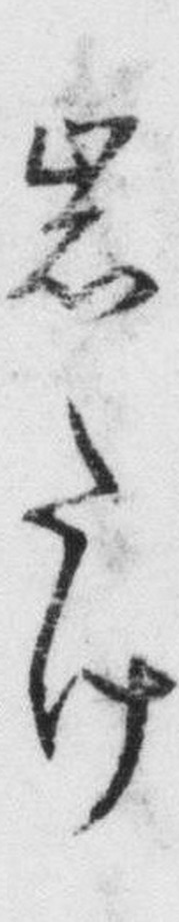初たけ
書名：普茶料理抄
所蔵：大阪府立大学学術情報センター 国文学研究資料館
